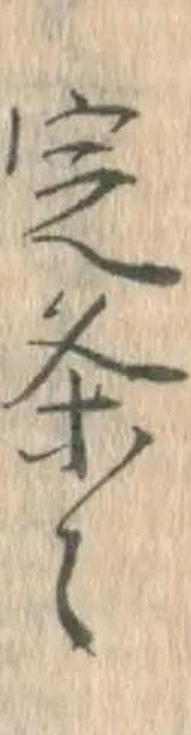定条々
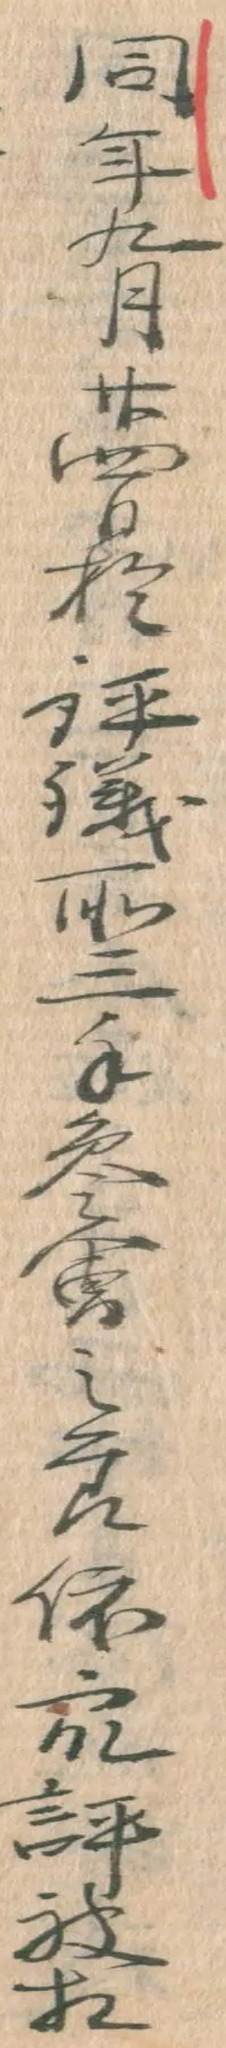同年九月廿四日於評議所三手参會之節依衆評致相
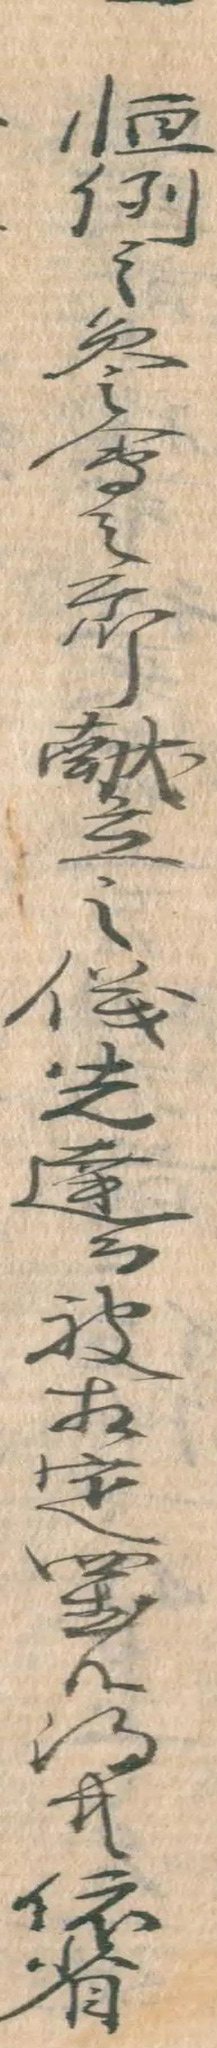一恒例之参會之節献立之儀先達而被相定置候得共依省
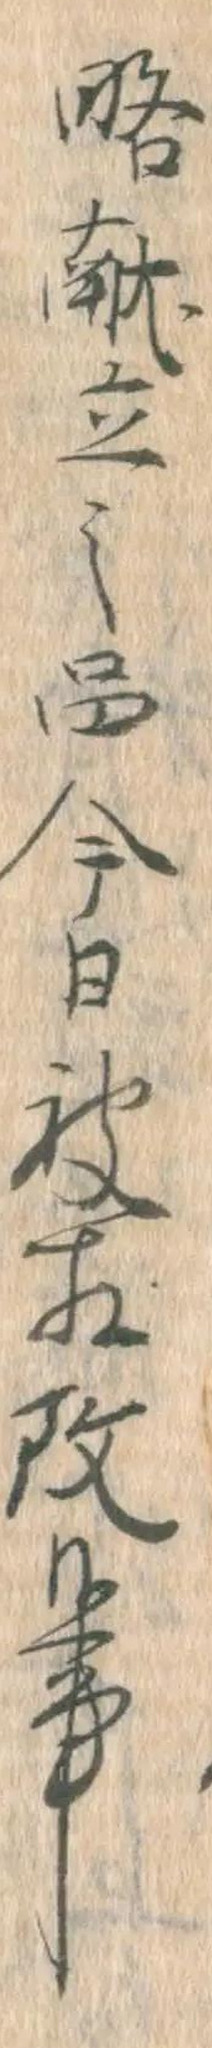略献立之品今日被相改候事
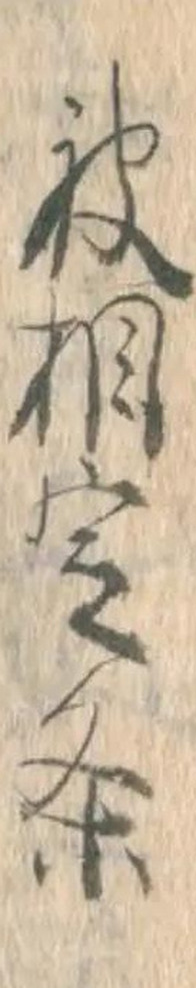被相定条
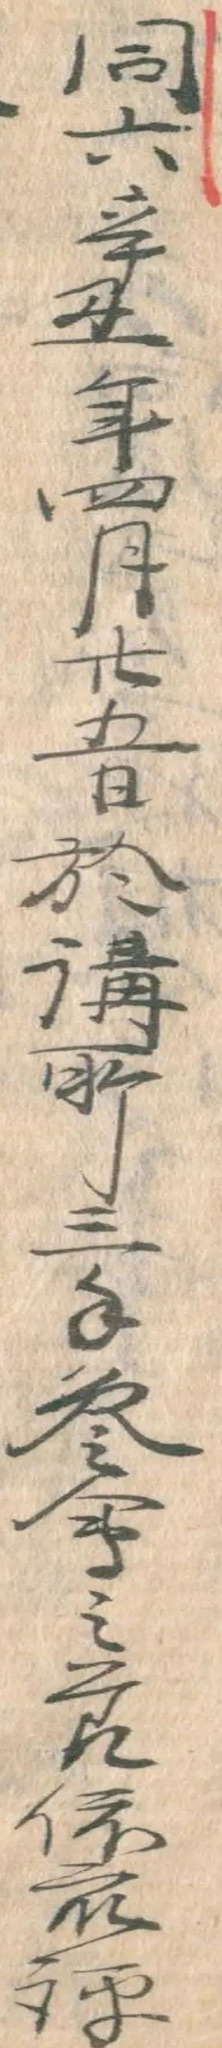同六辛丑年四月廿五日於講所三手参会之節俸衆評
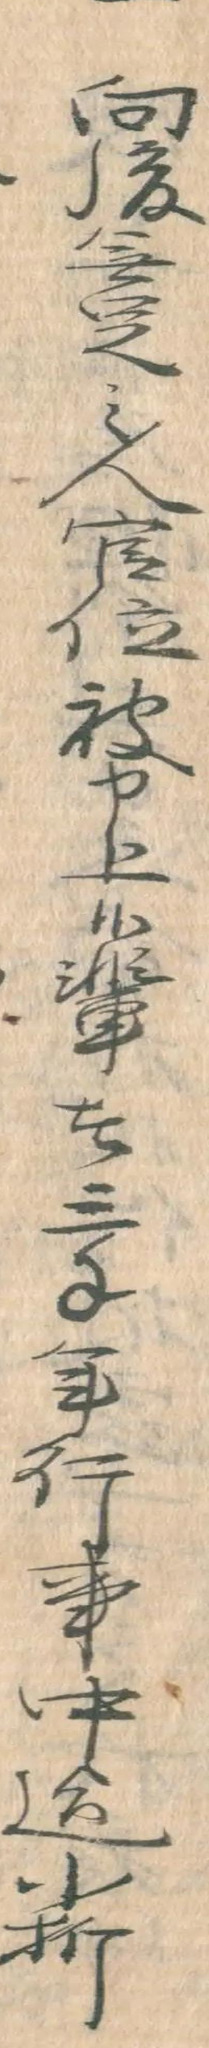一向後無足之人官位被申上候輩は三手年行事中迄小折
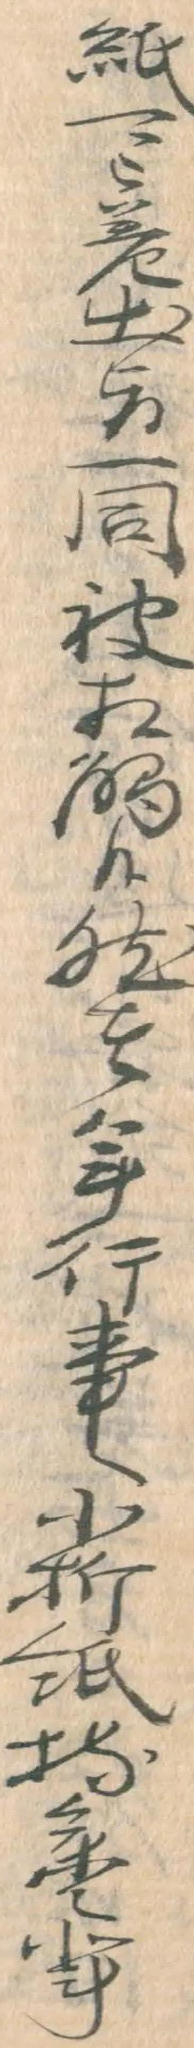紙可被差出旨一同被相觸候然者年行事へ小折紙持参之輩

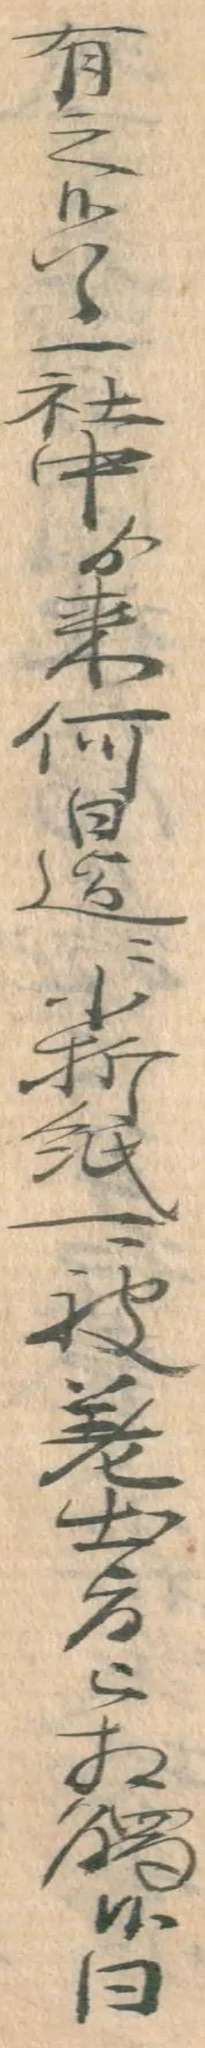有之候ハヽ一社中ゟ来何日迄ニ小折紙可被差出旨被相觸候日
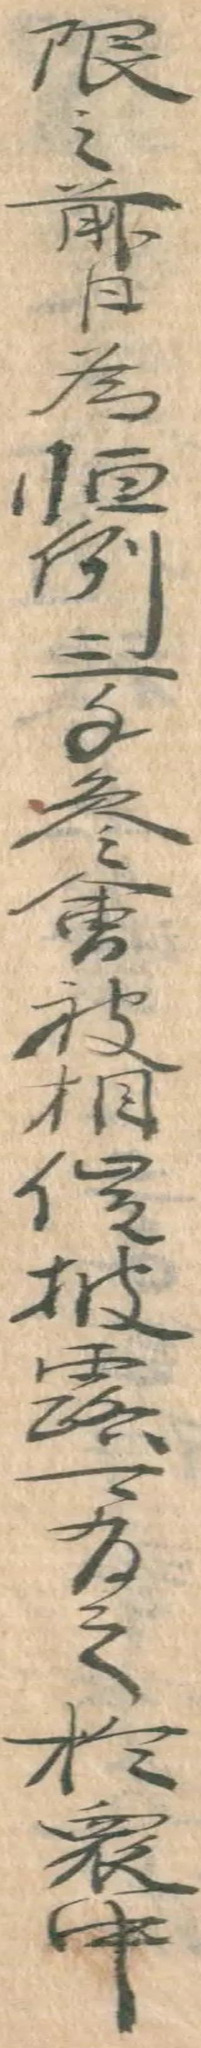限之前日為恒例三手参會被相催披露可有之於衆中
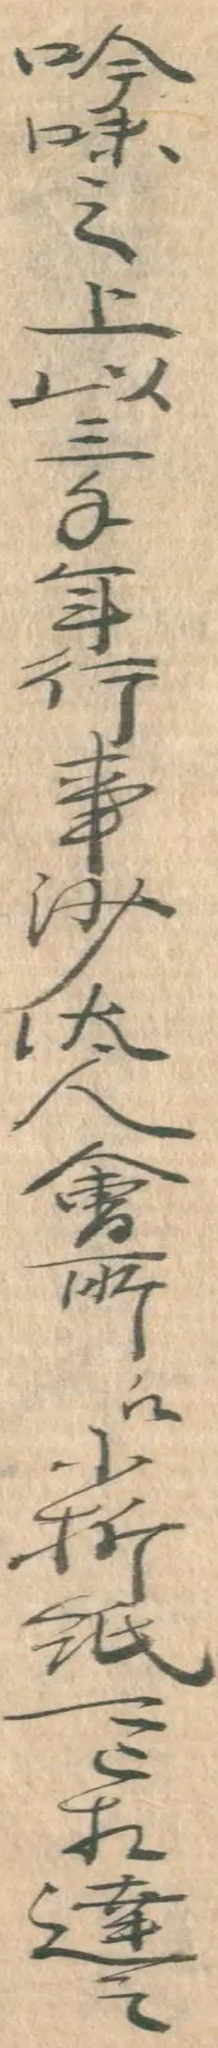吟味之上以三手年行事沙汰人會所え小折紙可被相達之
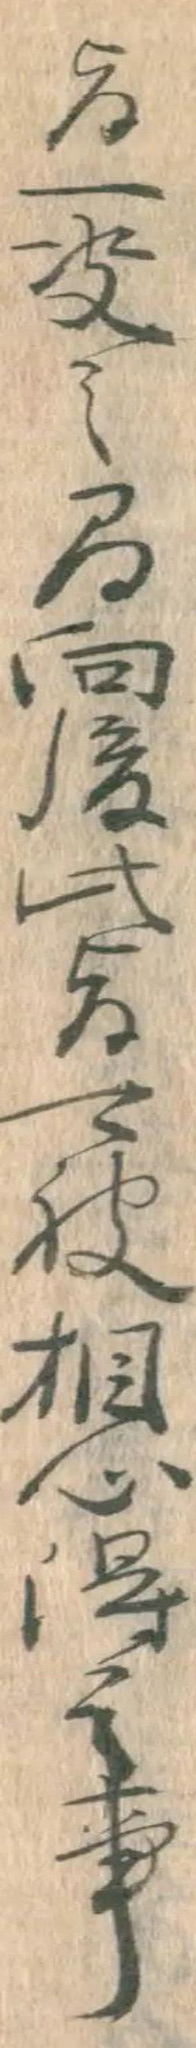旨一決之間向後此旨可被相心得之事
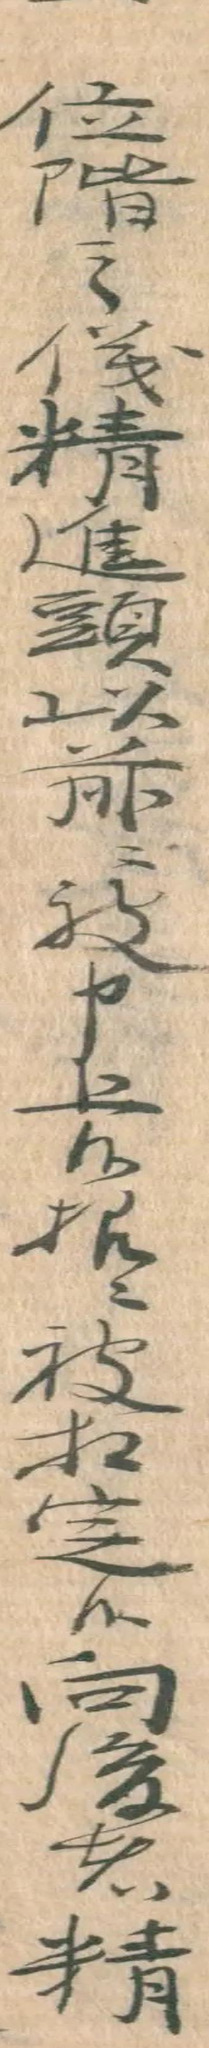一位階之儀精進頭以前ニ被申上候様ニ被相定候向後は精
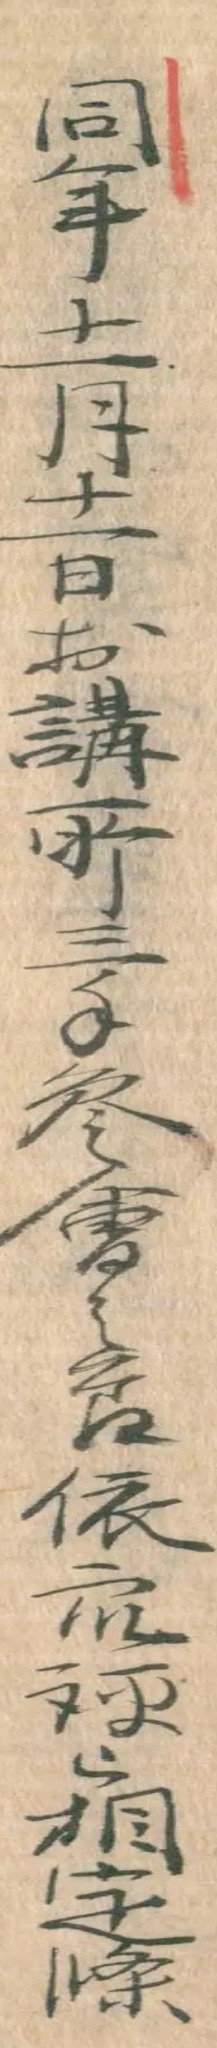同年十一月十一日於講所三手参會之節依衆評被相定條
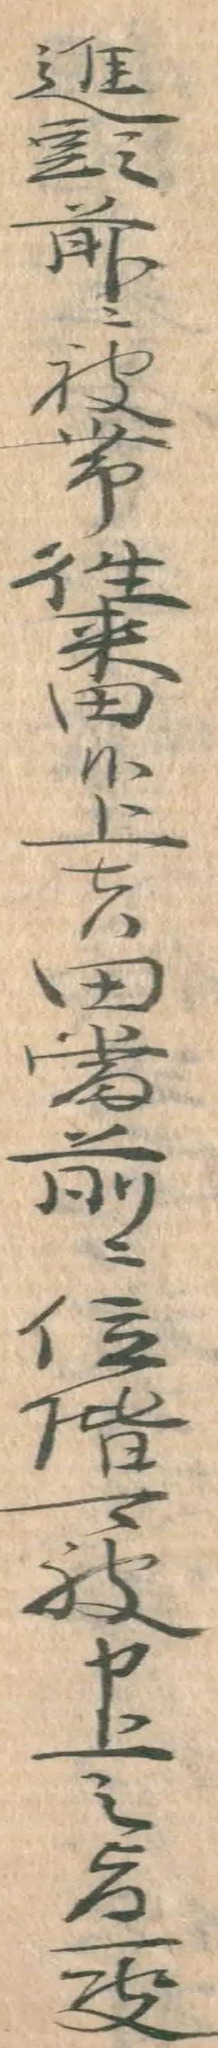進頭前ニ被帯往来田候上は田當前ニ位階可被申上之旨一決
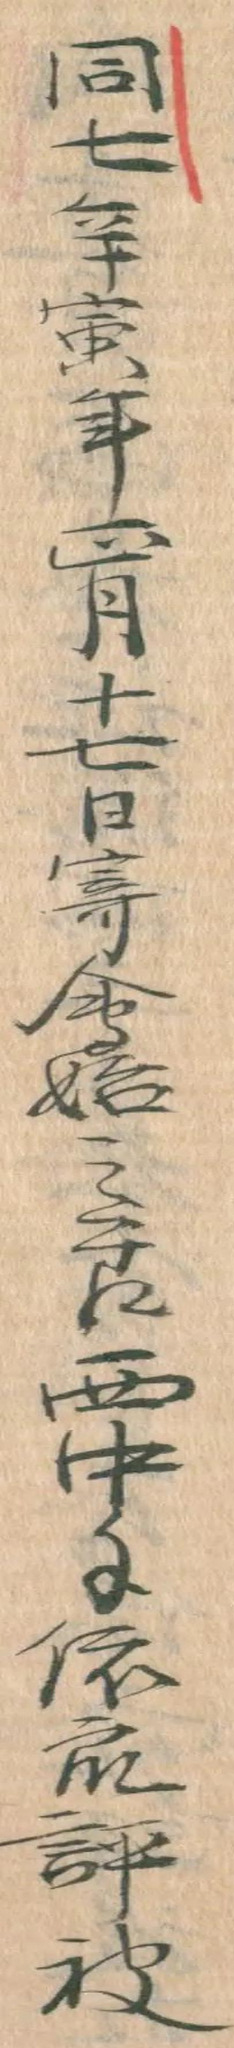同七年寅年正月十七日寄會始之節西中手依衆評被
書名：賀茂社記録. 第29冊
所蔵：国立国会図書館 National Diet Library, JAPAN
